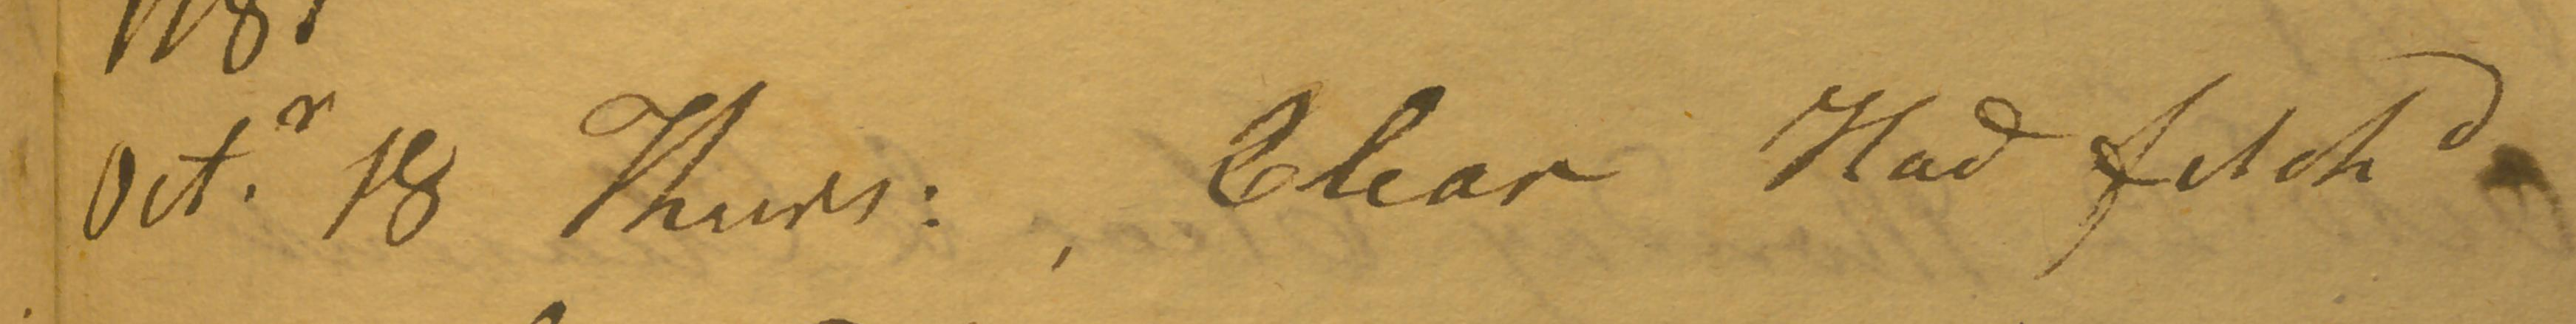Oct^r. 18 Thurs: Clear Had fetch^d
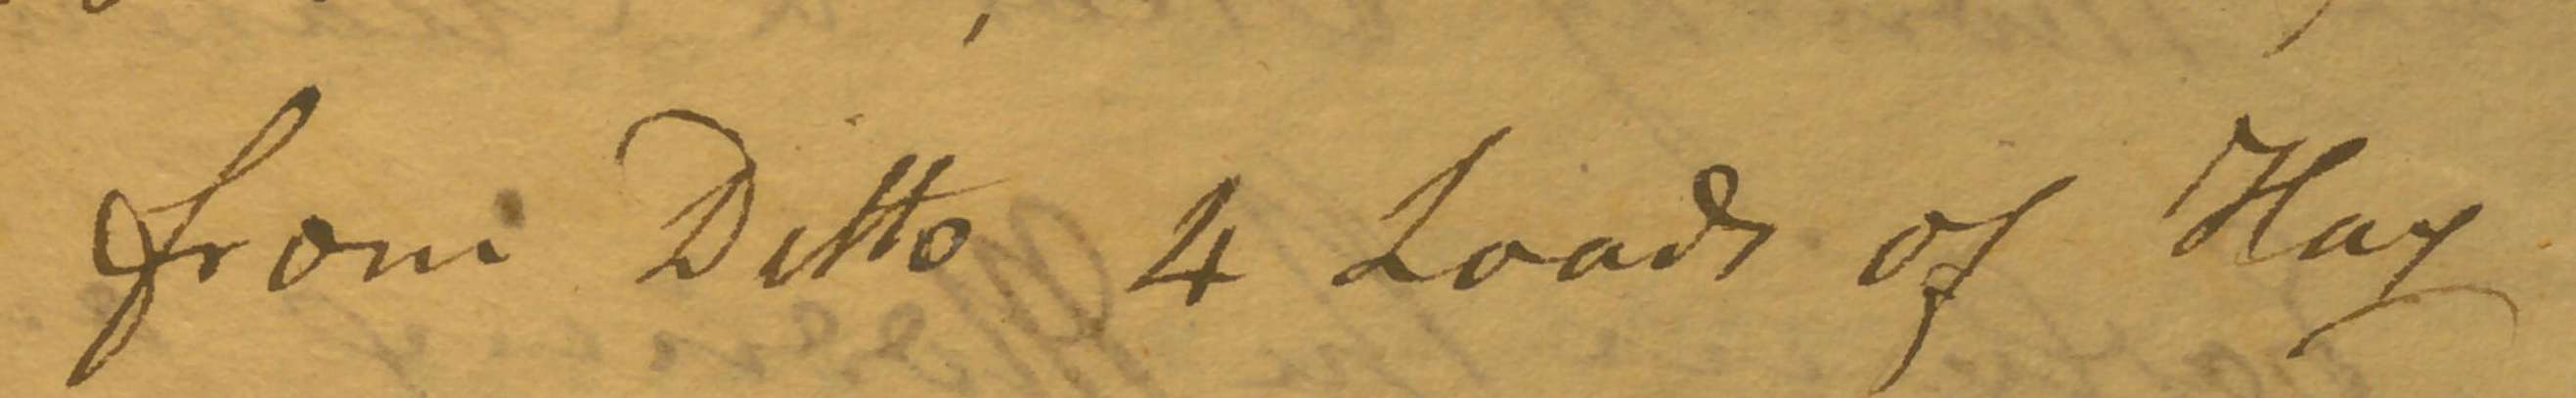from Ditto 4 Loads of Hay
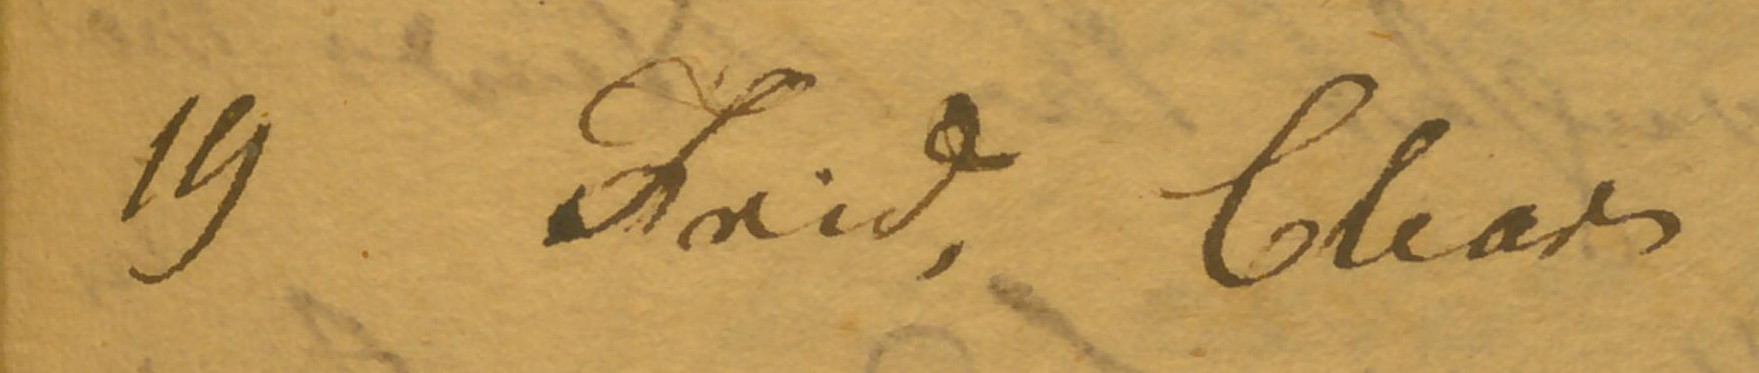19 Frid. Clear
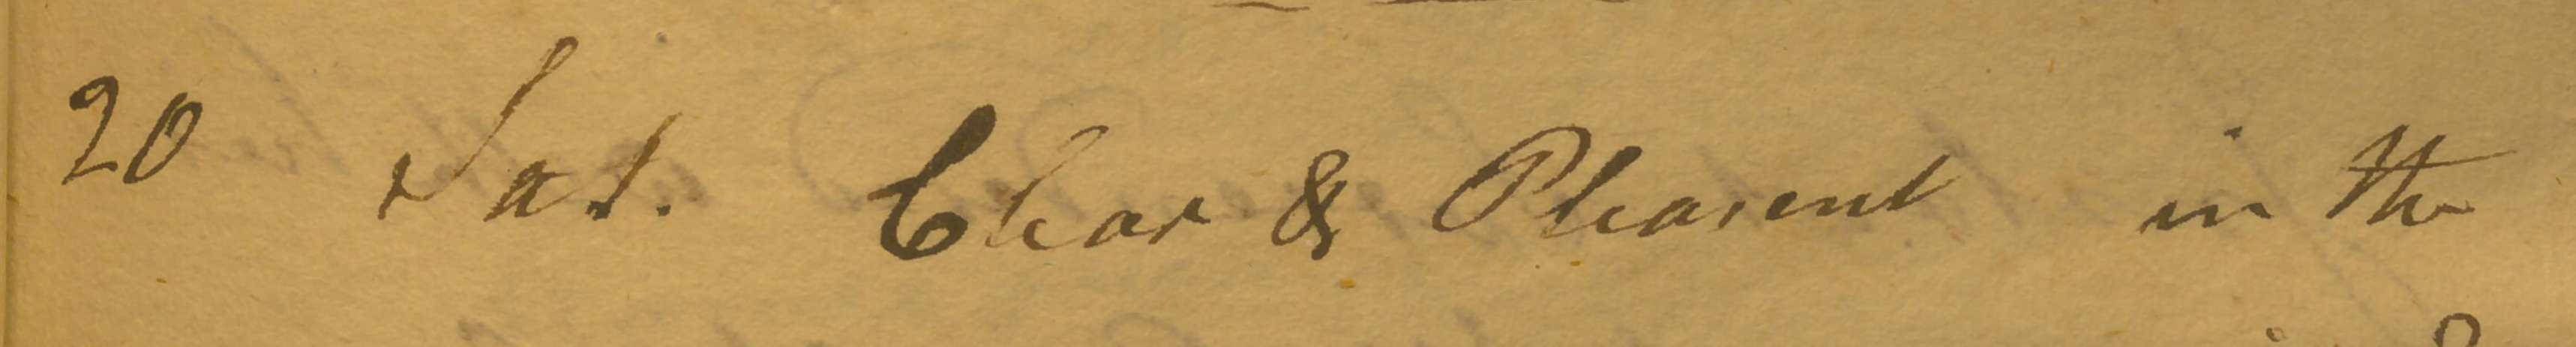20 Sat. Clear & Pleasent in the
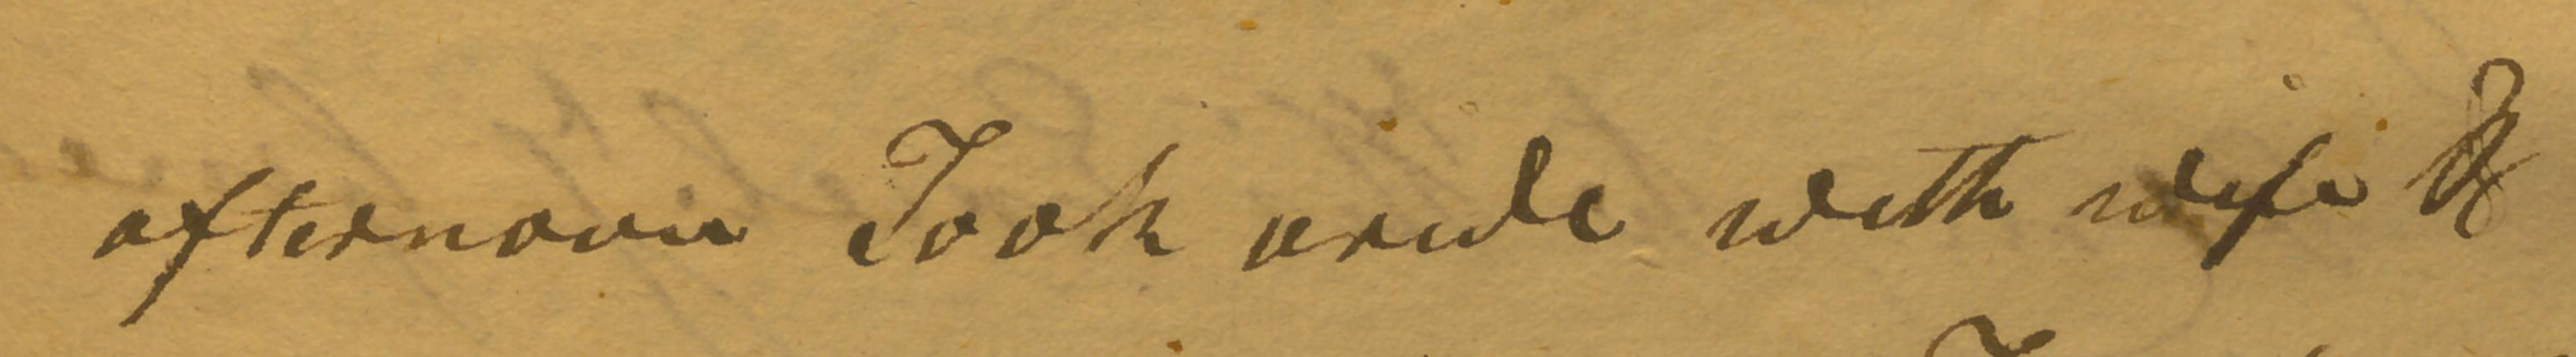afternoon Took a ride with wife &
